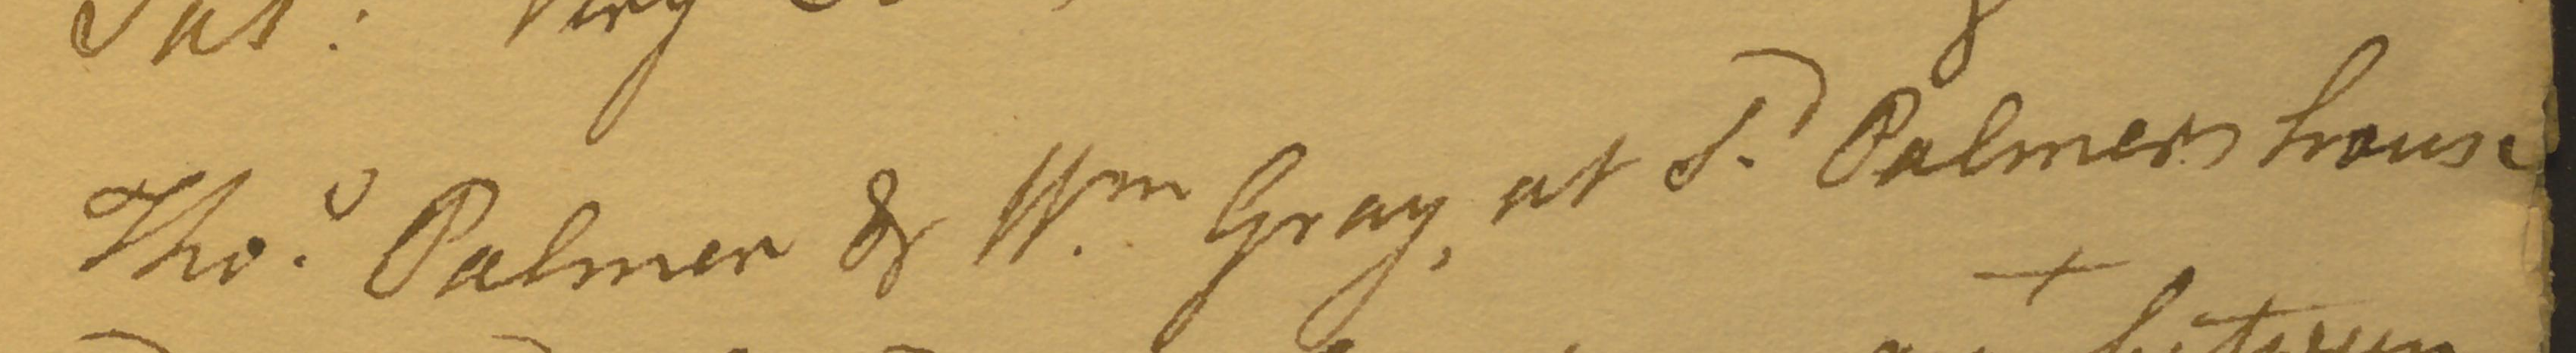Tho^s. Palmer & W^m. Gray at s^d. Palmers house
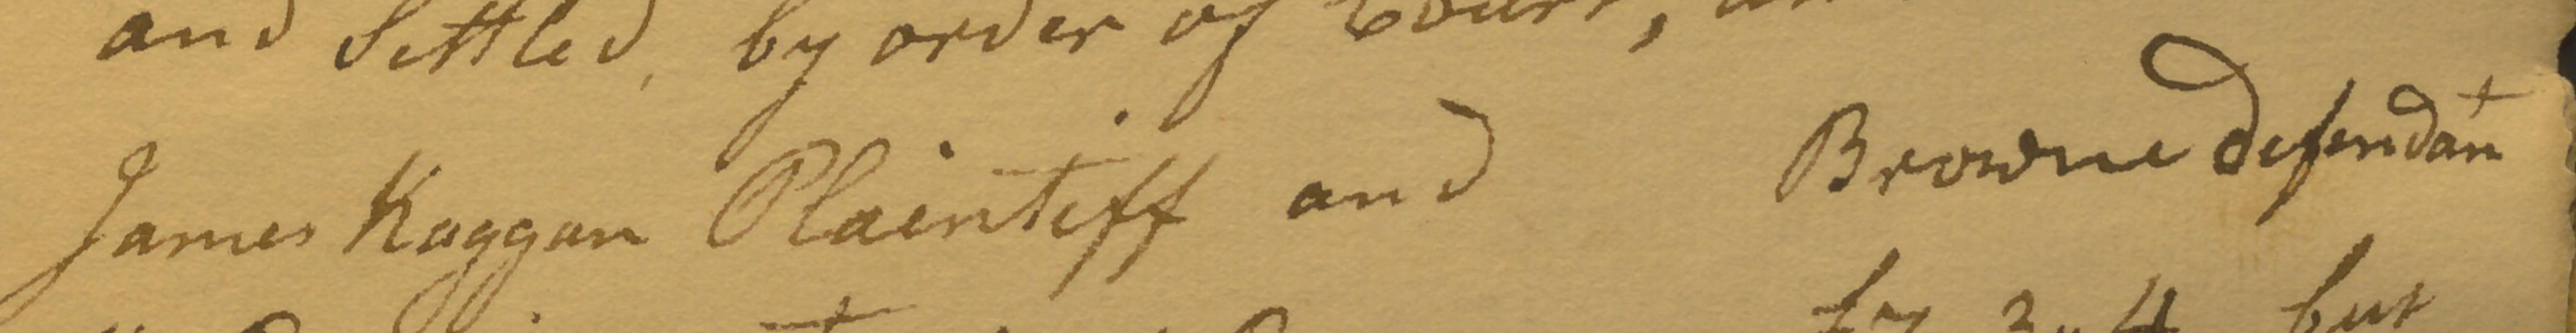James Kaggan Plaintiff and Browne defendan^t
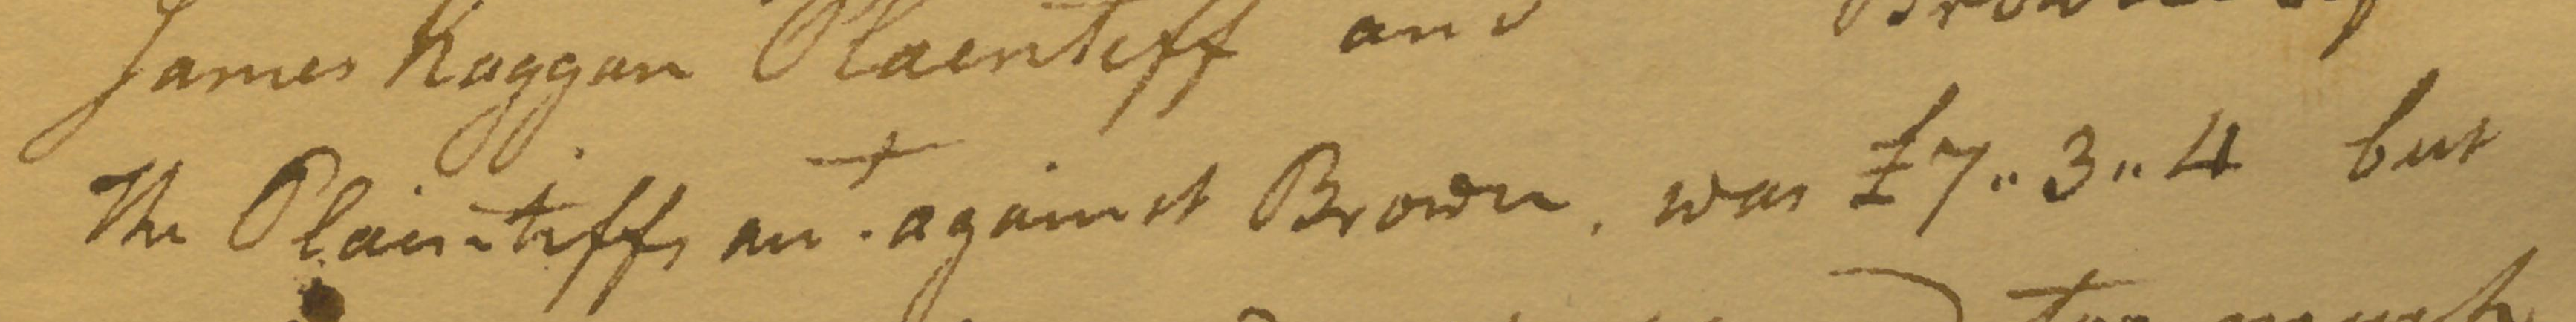The Plaintiffs acc^t. against Brown, was £7..3.. 4 but
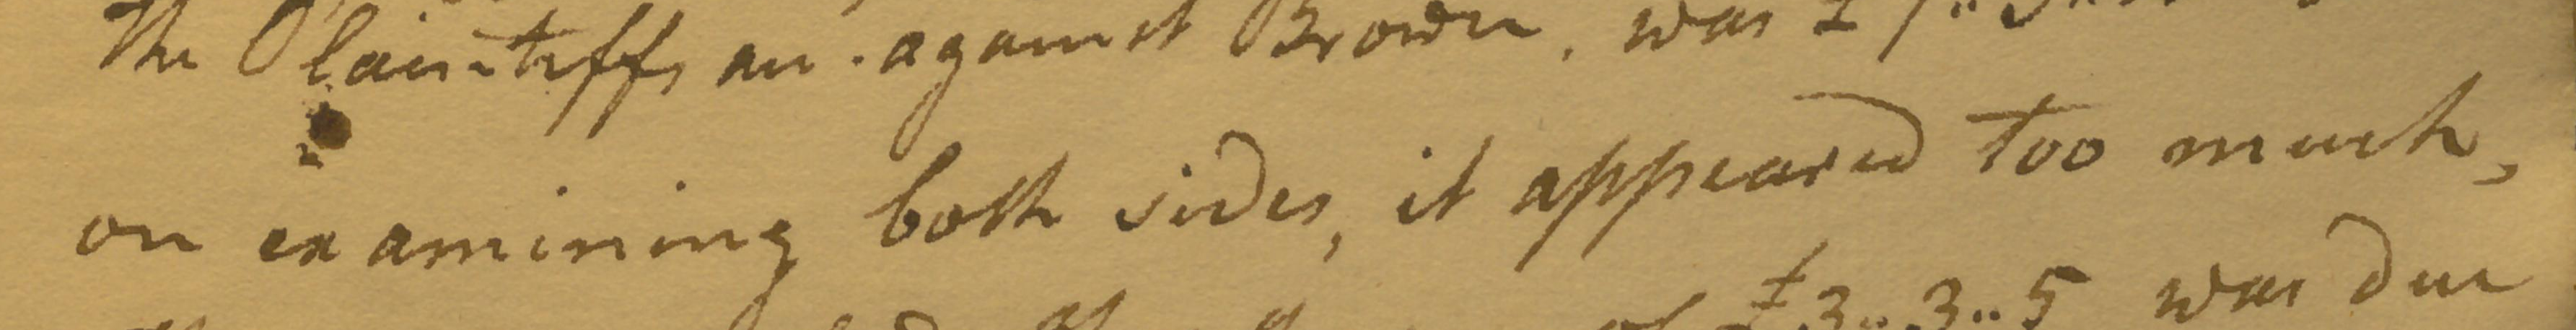on examining both sides it appeared too much
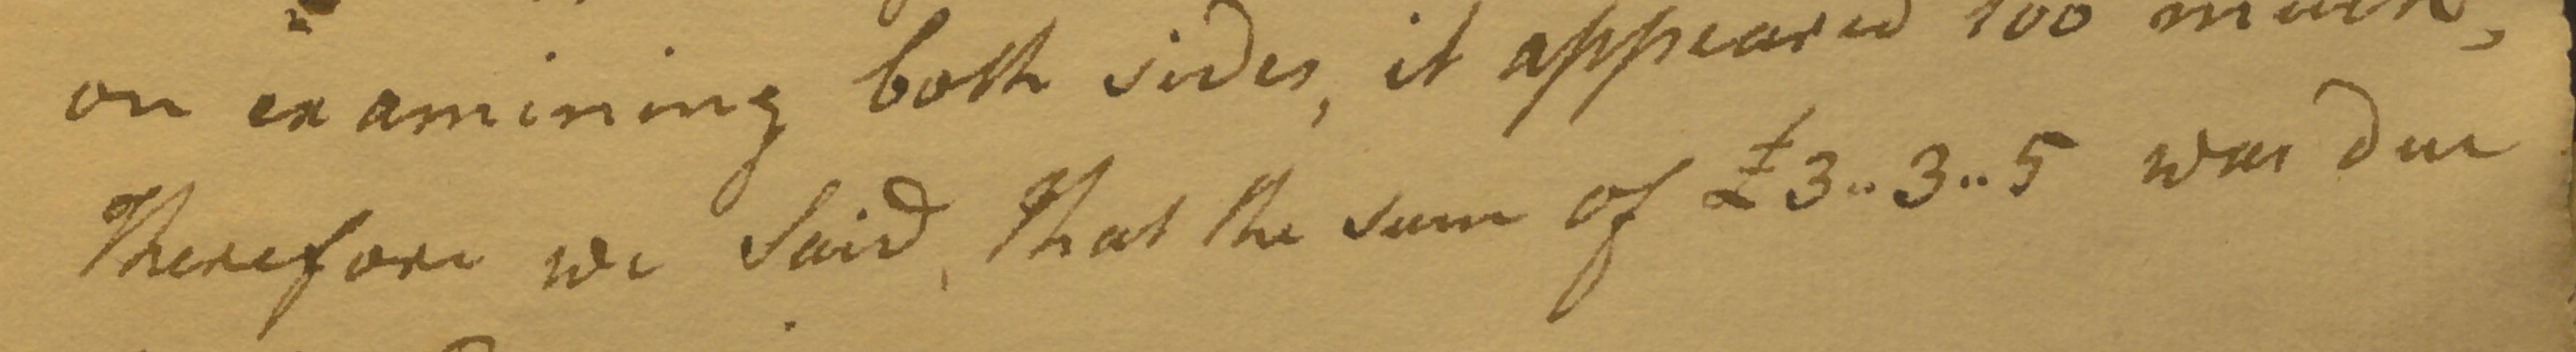Therefore we said that the sum of £3..3..5 was due
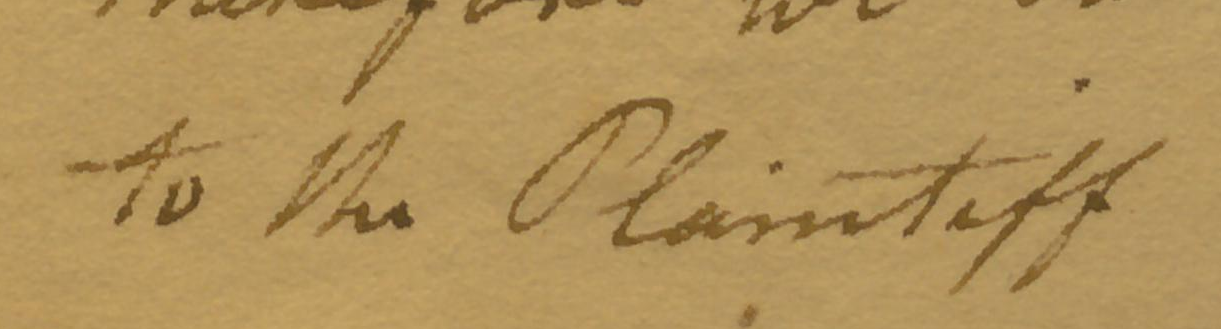to the Plaintiff
